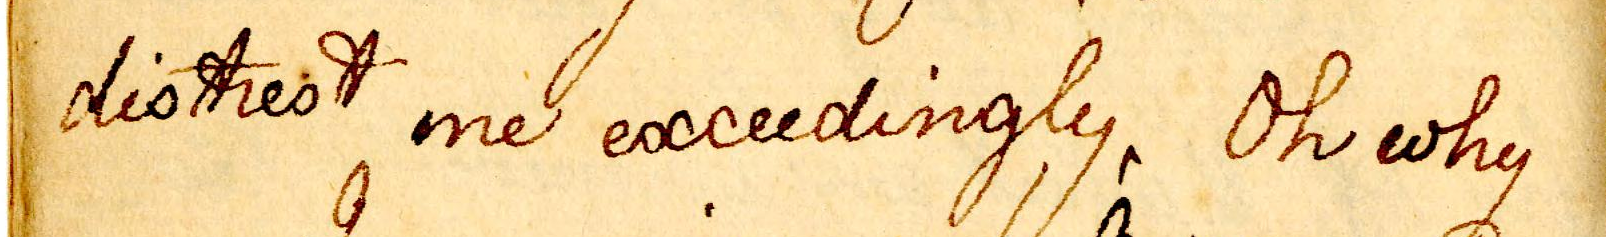distrest me exceedingly, Oh why
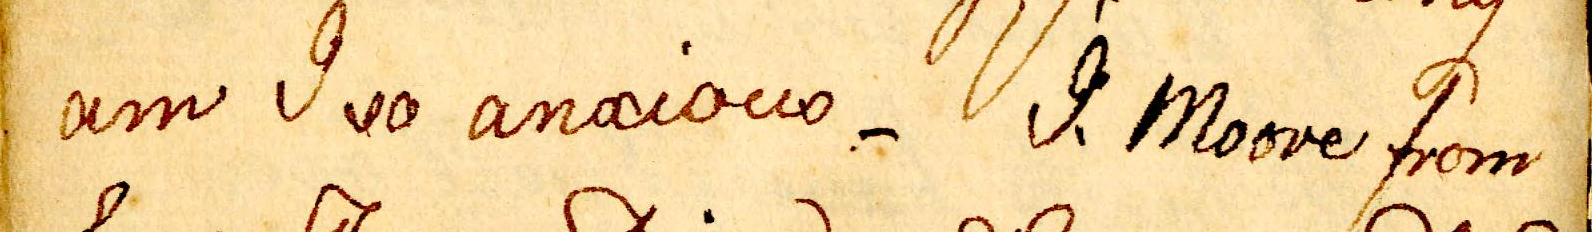am I so anxious- I. Moore from
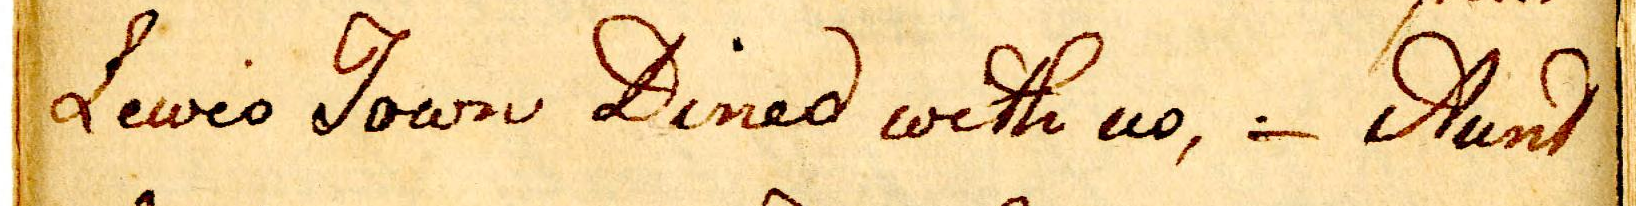Lewis Town Dined with us,- Aunt
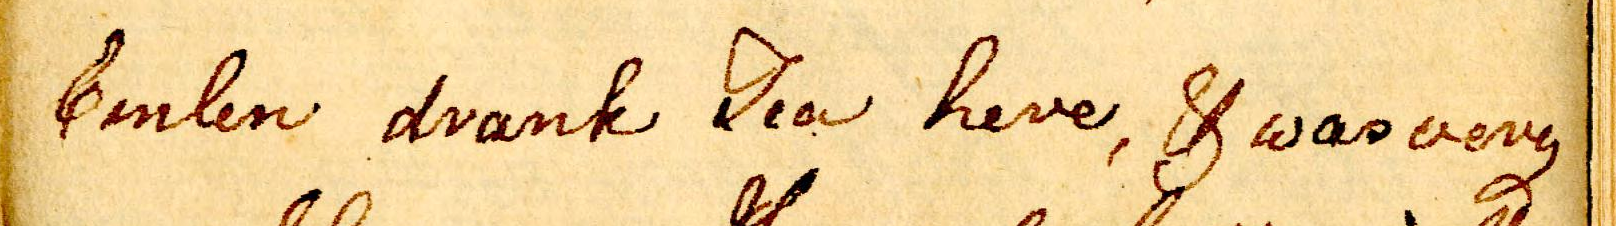Emlen drank Tea here, & was very
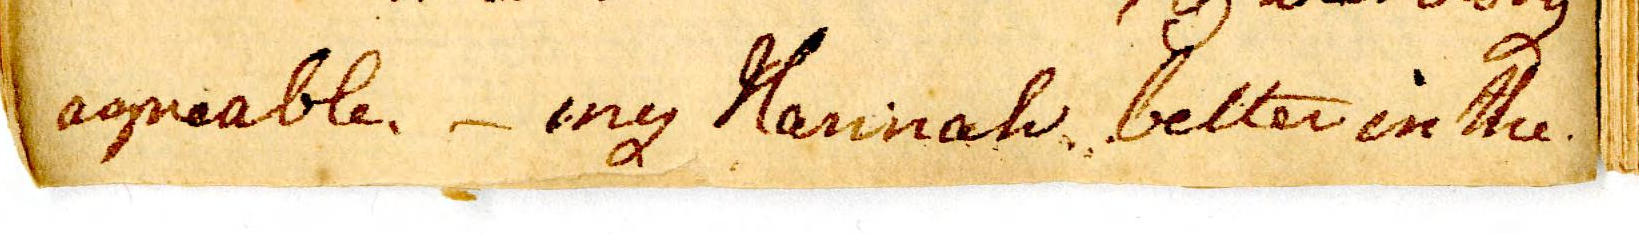agreable,- my Hannah better in the
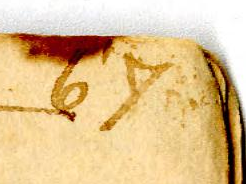67
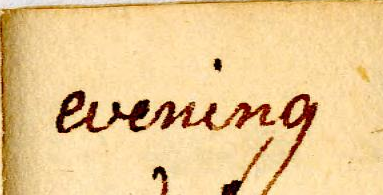evening
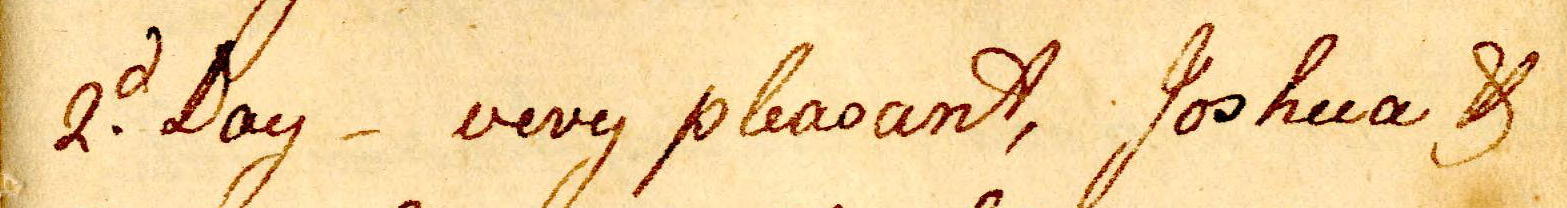2^d. Day- very pleasant, Joshua &
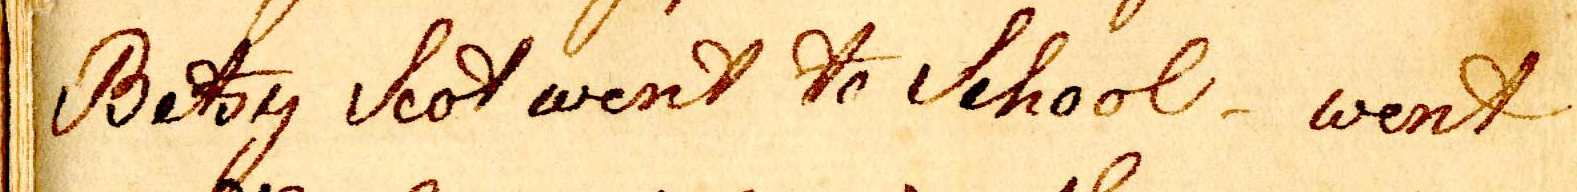Betsy Scot went to School- went
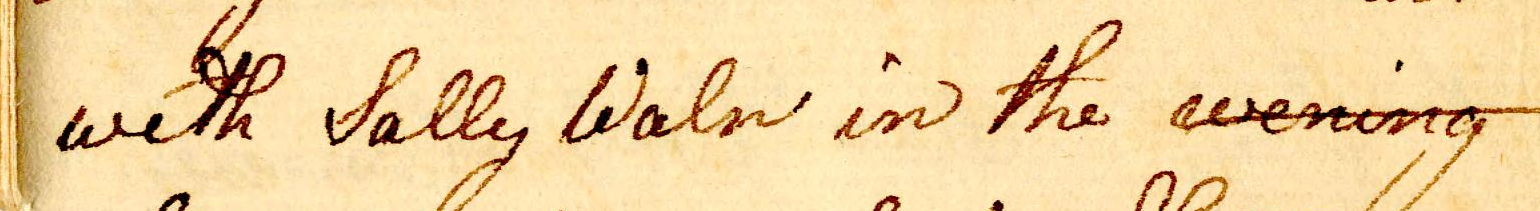with Sally Waln in the evening
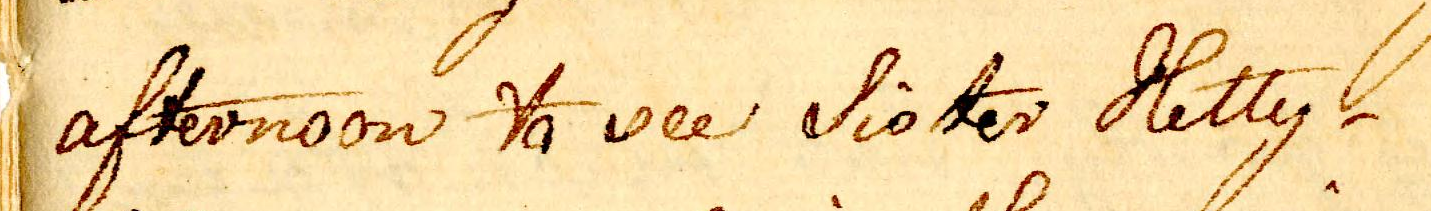afternoon to see Sister Hetty-
